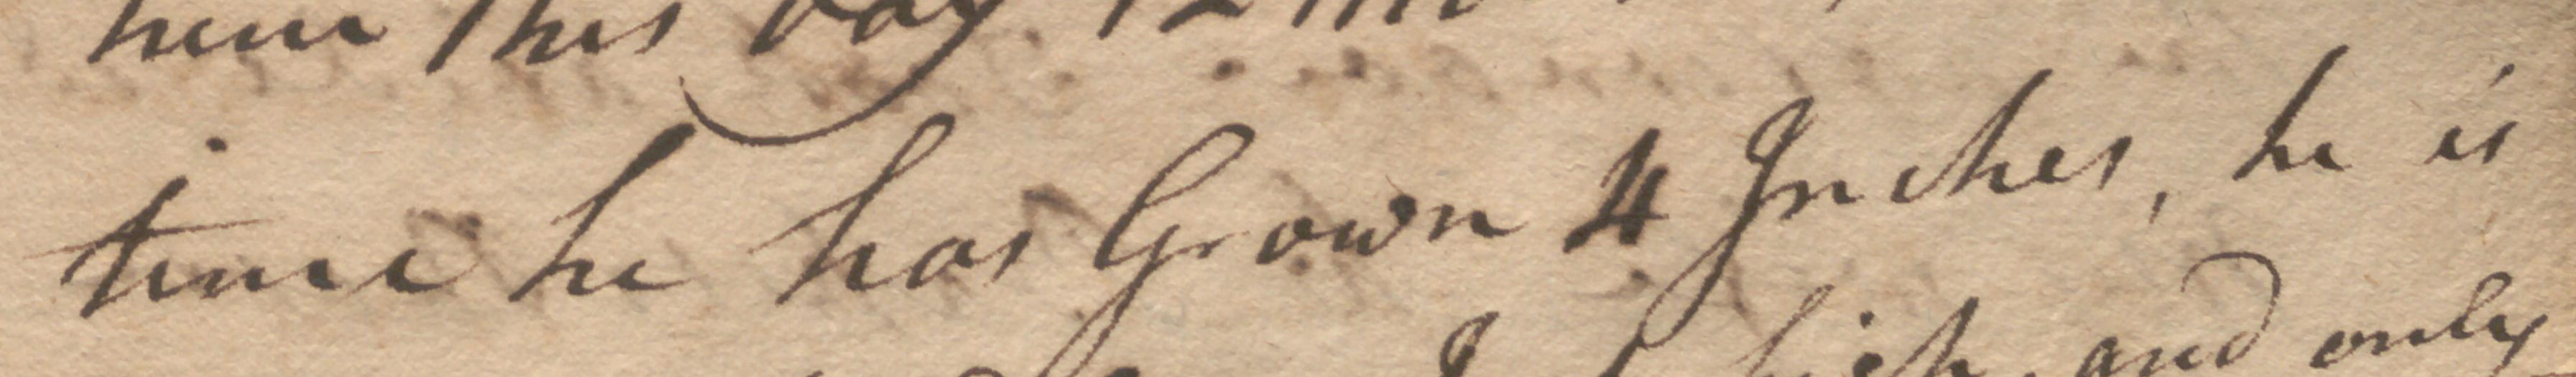time he has Grown 4 Inches, he is
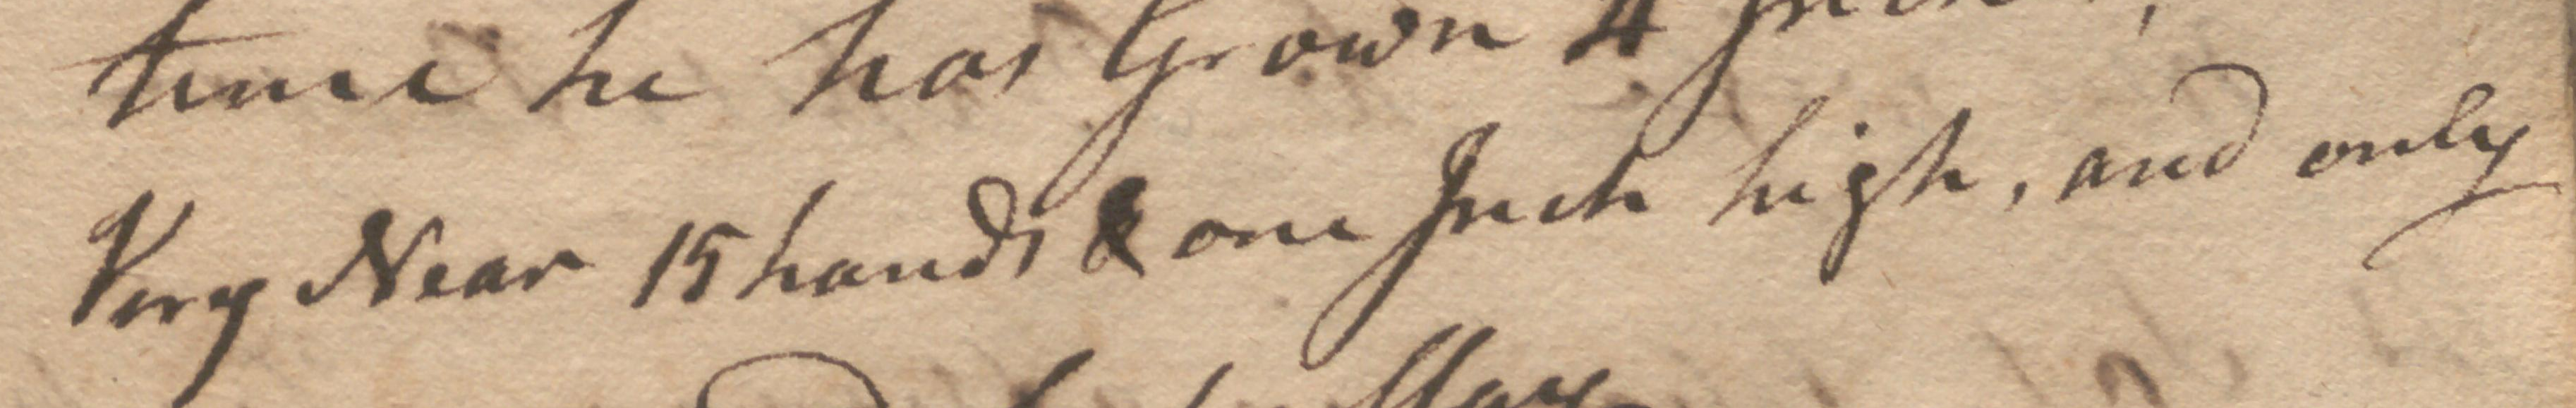Very Near 15 hands & one Inch high, and only
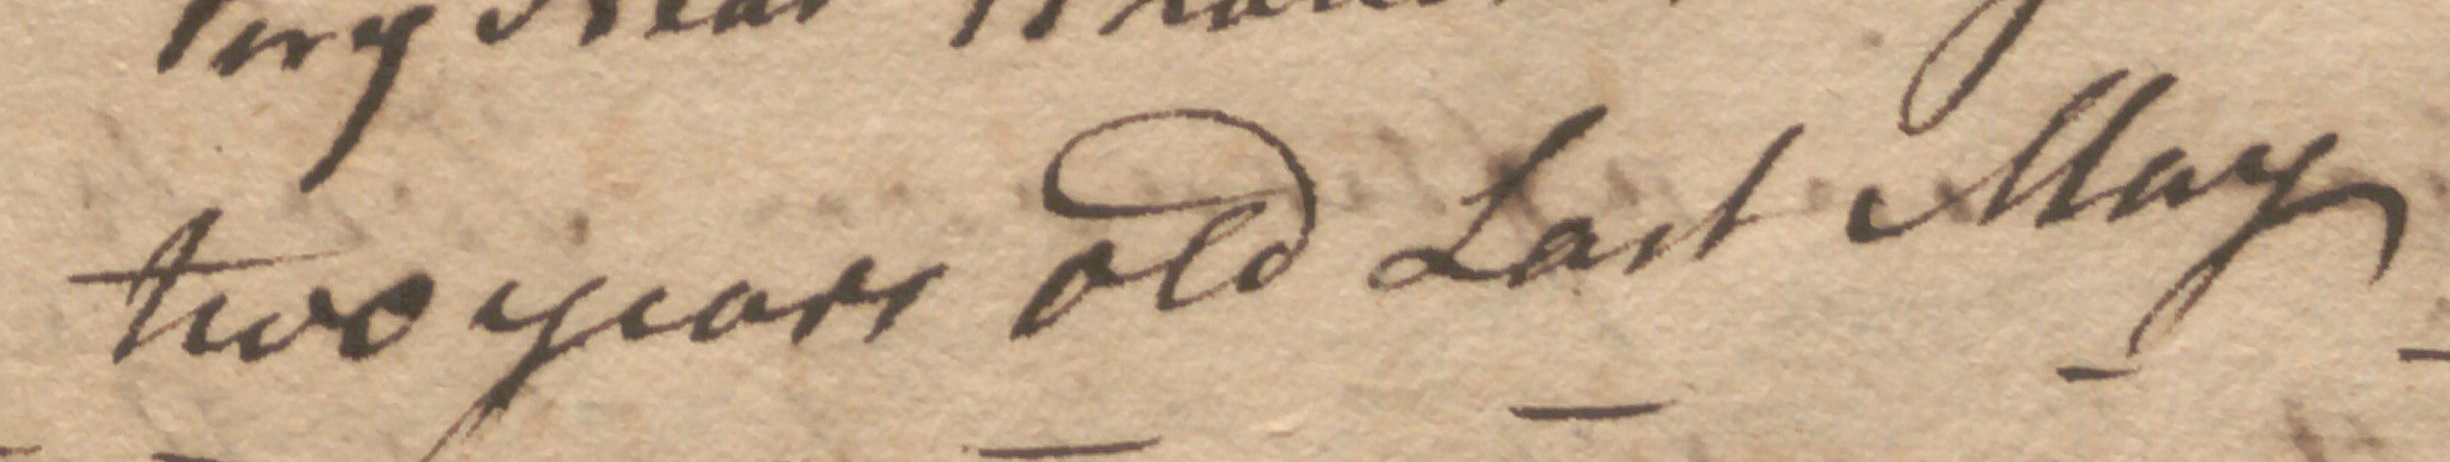two years old Last May
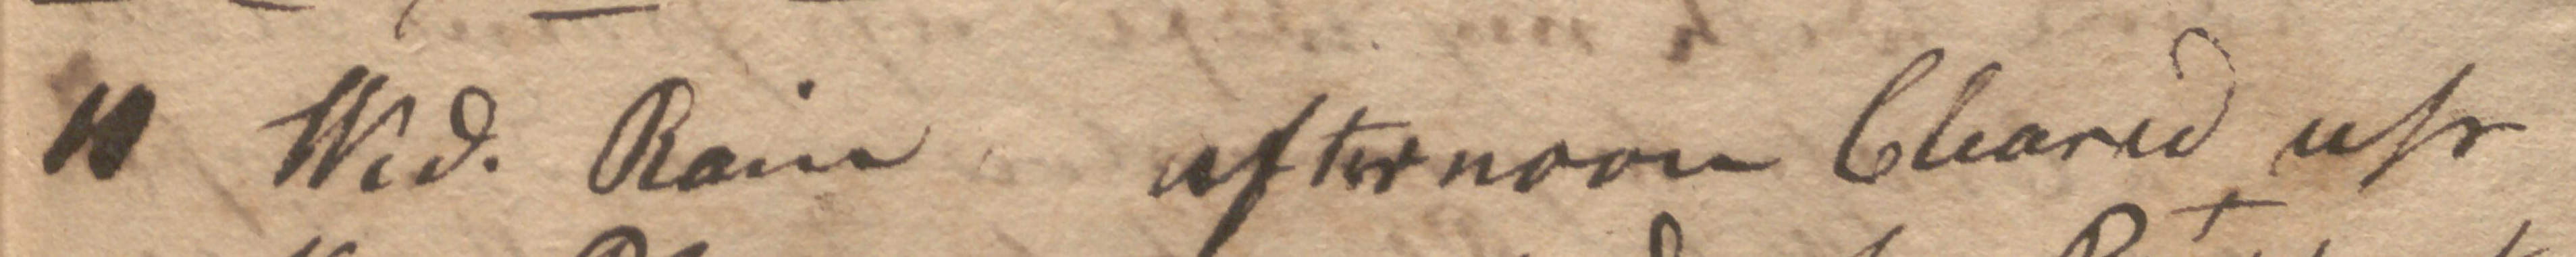11 Wed. Rain, afternoon Cleared up
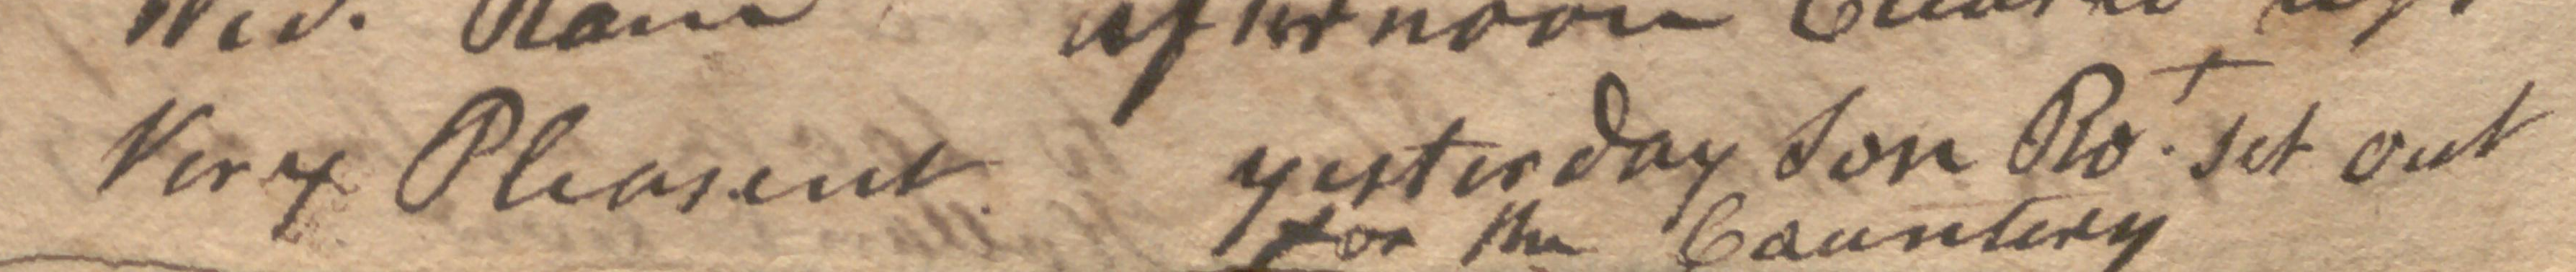Very Pleasent yesterday son Ro^t. set out
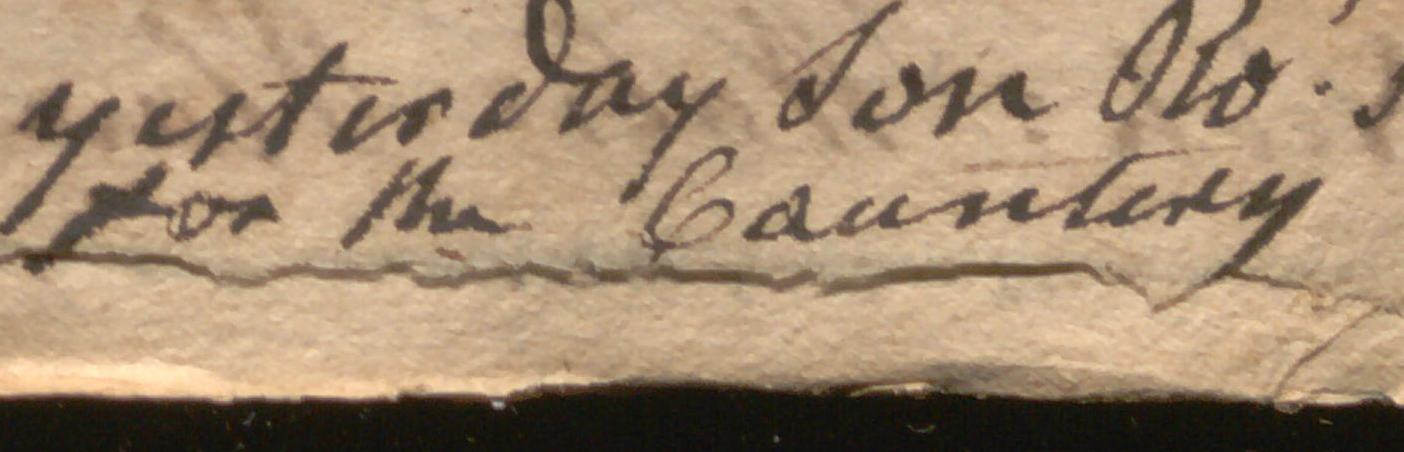For the Cauntery
